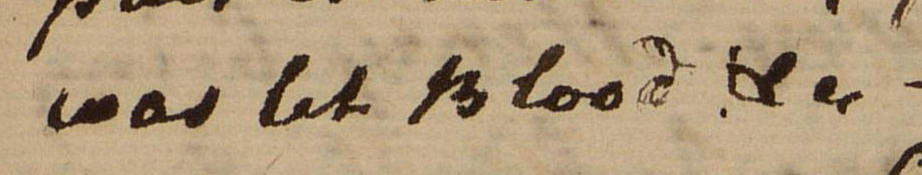was let Blood &c -
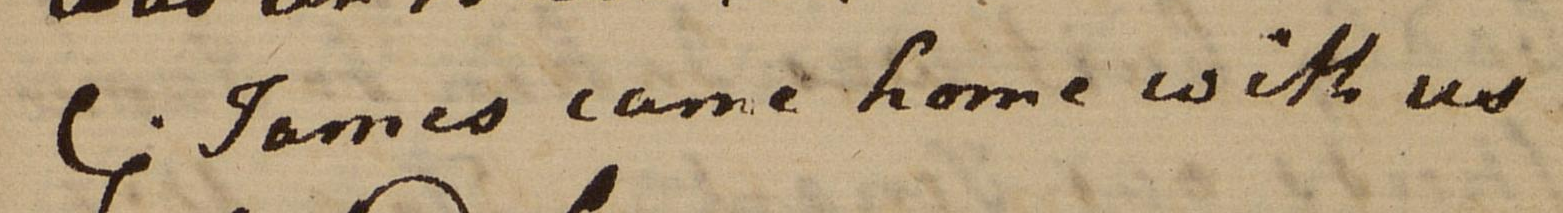C. James came home with us
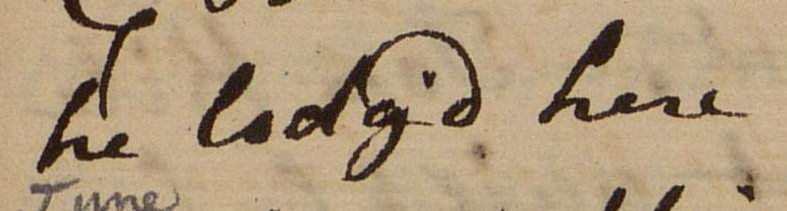he lodg'd here
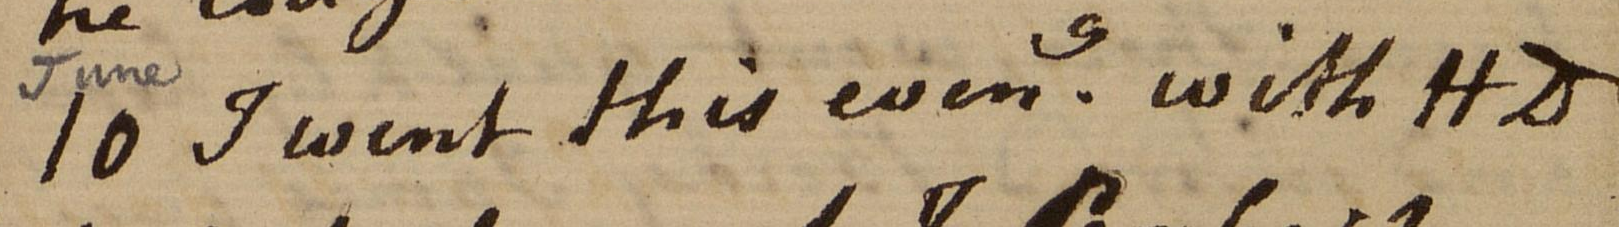10 I went this even^g. with HD
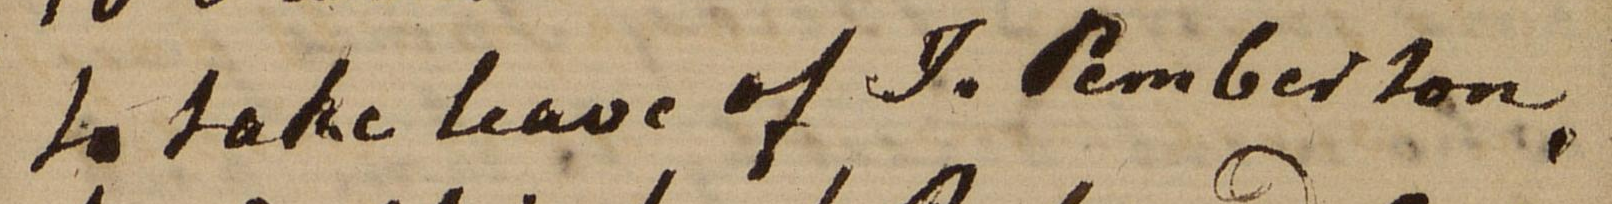to take leave of J. Pemberton,
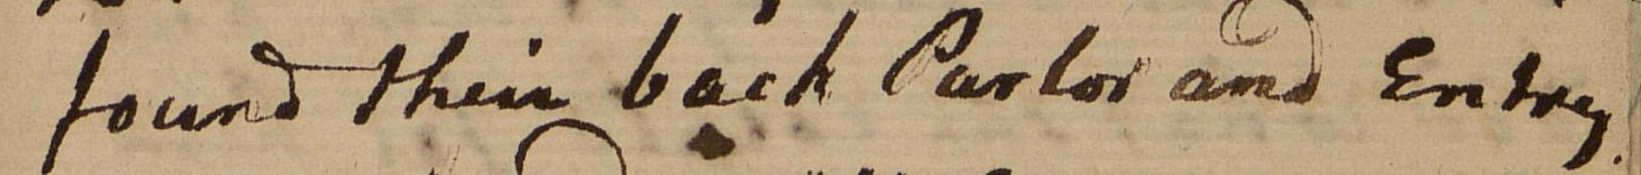found their back Parlor and Entry
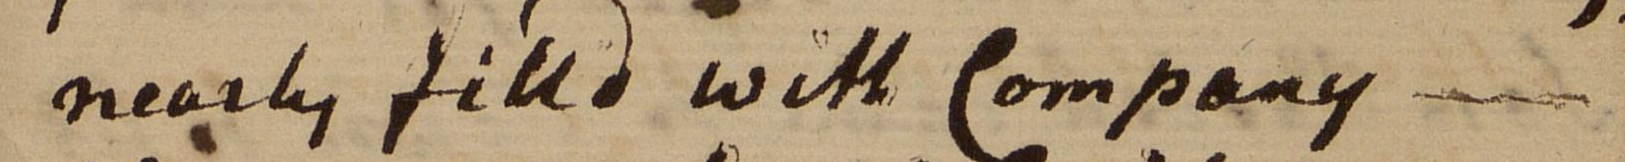nearly filld with Company-
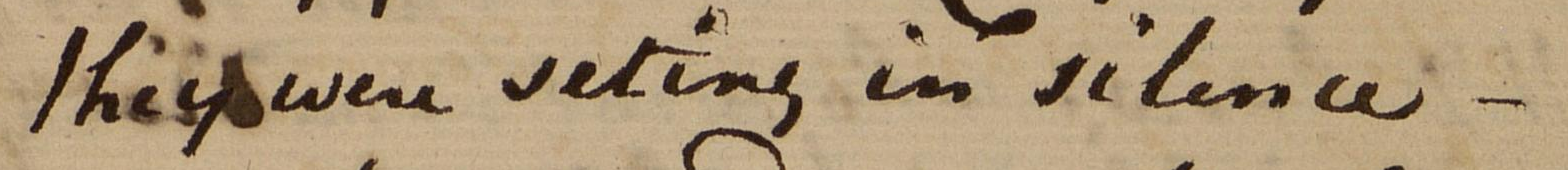they were seting in silence-
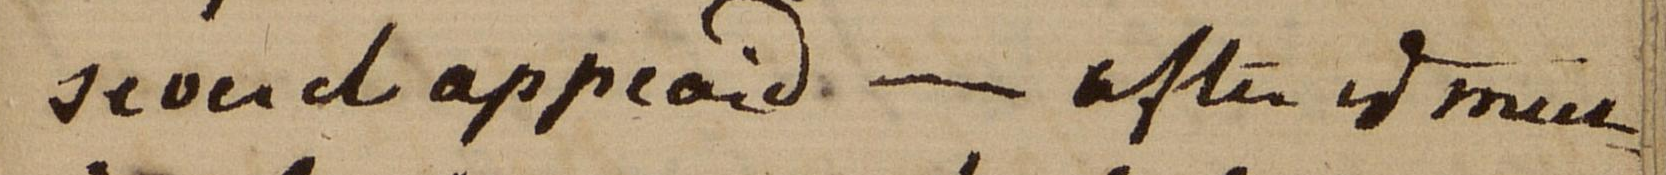several appear'd- after y^e meet
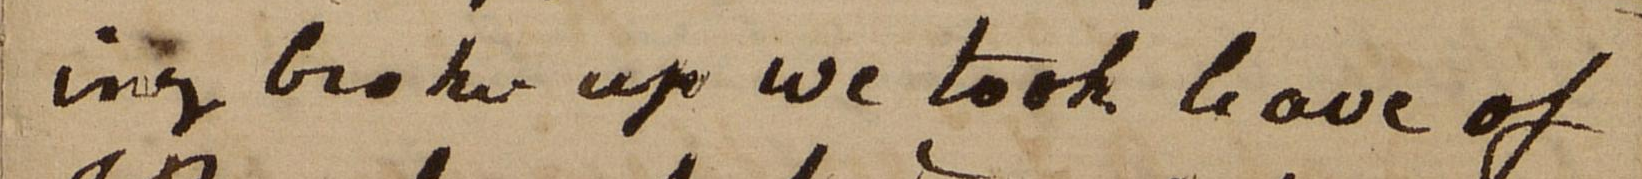ing broke up we took leave of
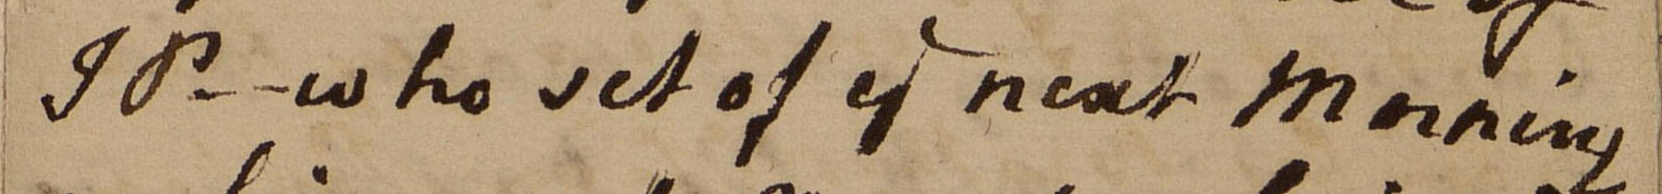JP- who set of y^e next Morning
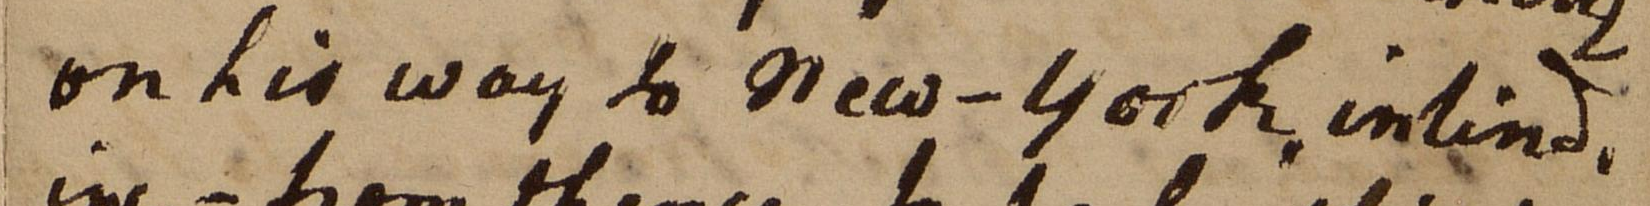on his way to New- York, intind-
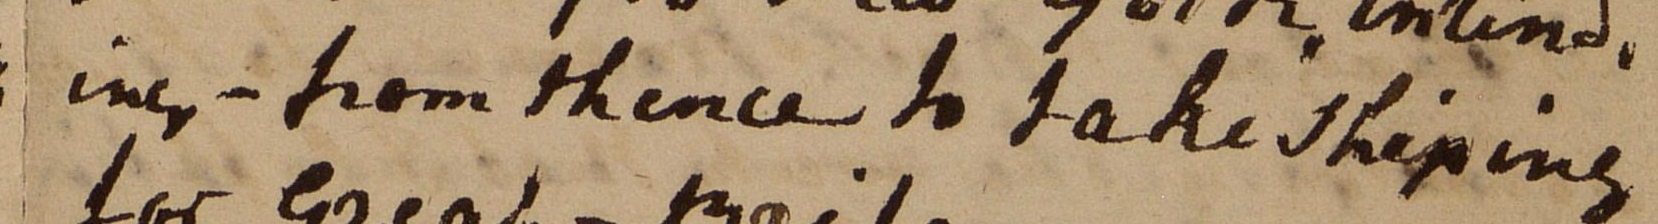ing- from thence to take shiping
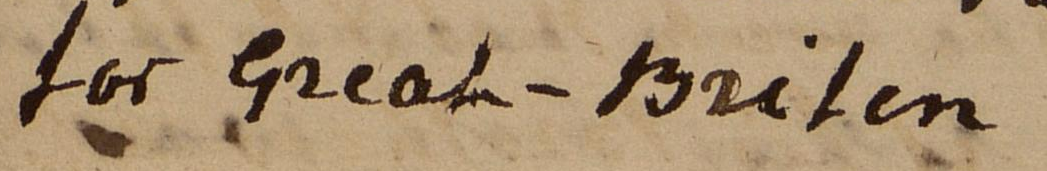for Great-Britan
